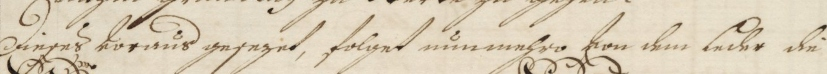Dieses voraus gesezet, folget nunmehro von dem Leder die
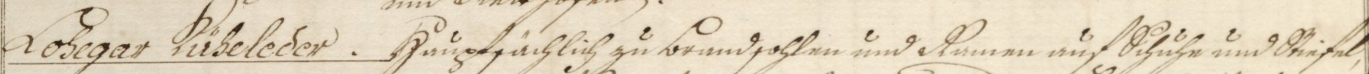Lohegar Hüheleder. Hauptsächlich zu Brandsohlen und Ramen auf Schuhe und Stiefel,
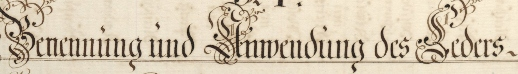Benennung und Anwendung des Leders
